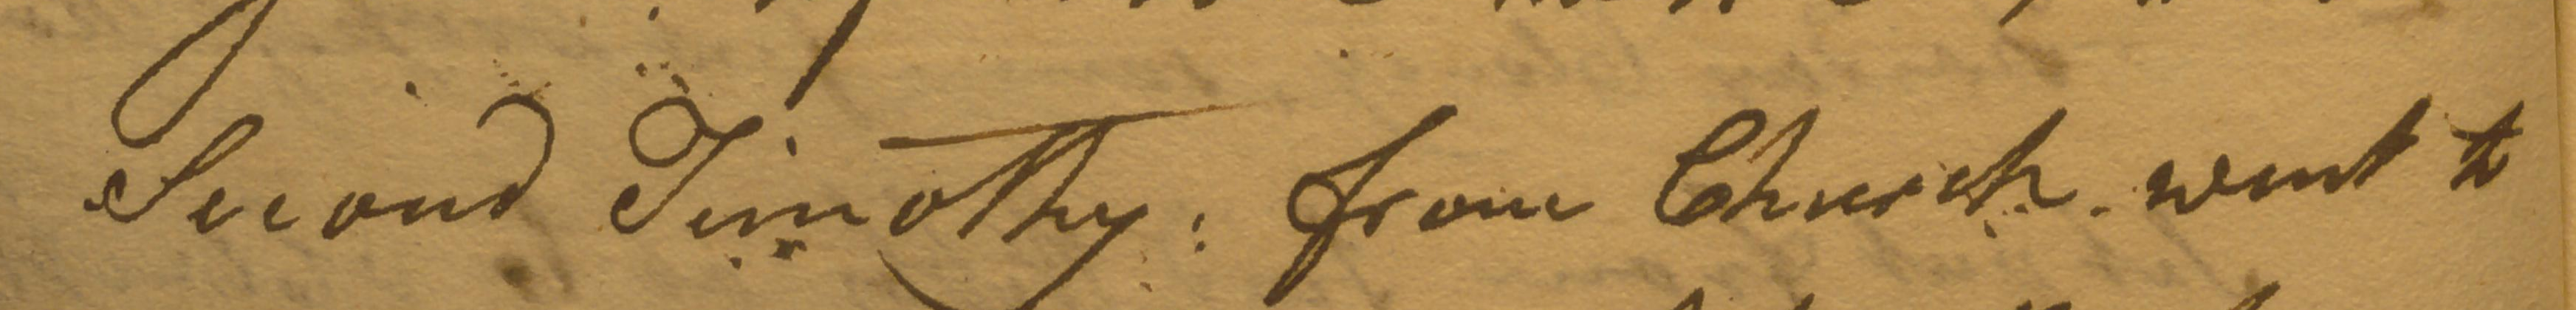Second Timothy. from Church went to
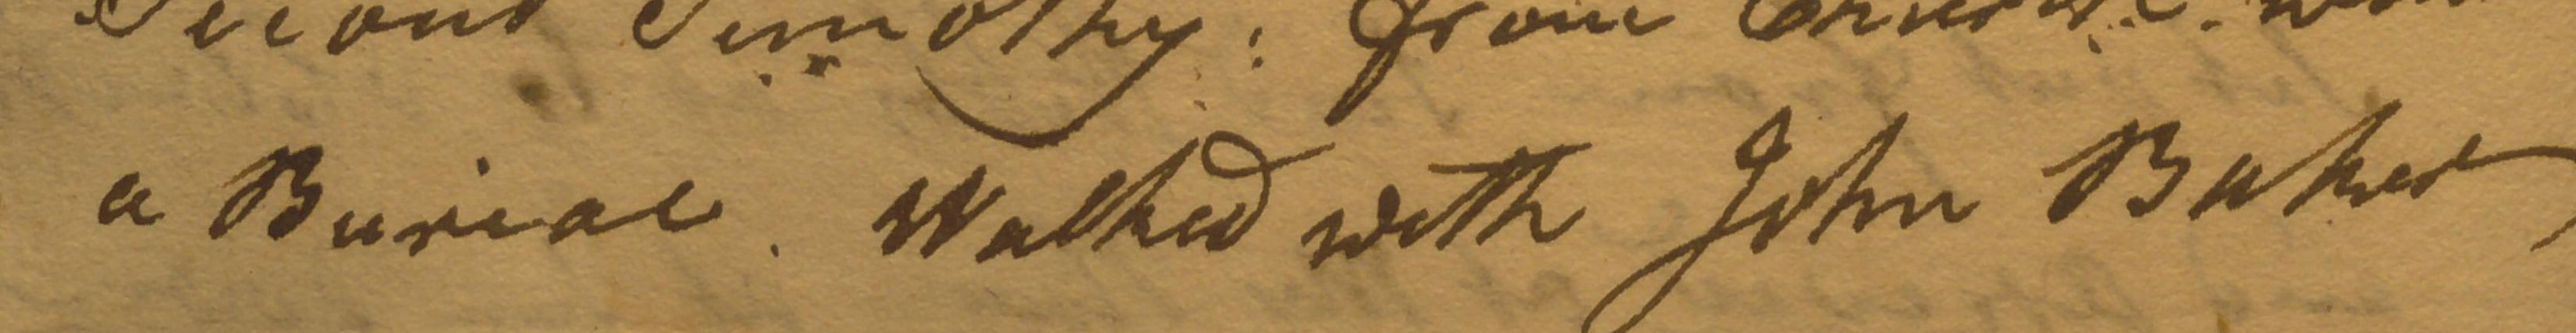a Burial, Walked with John Baker
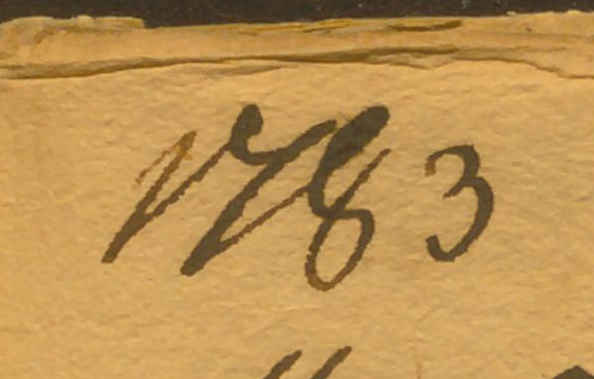1783
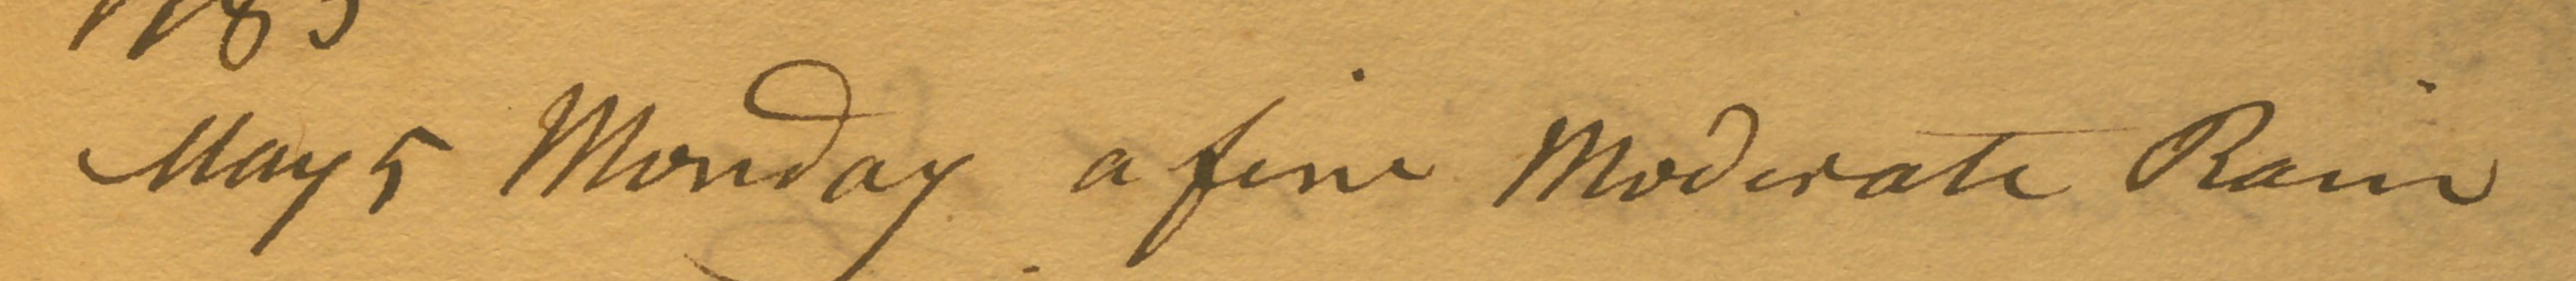May 5 Monday a fine Moderate Rain
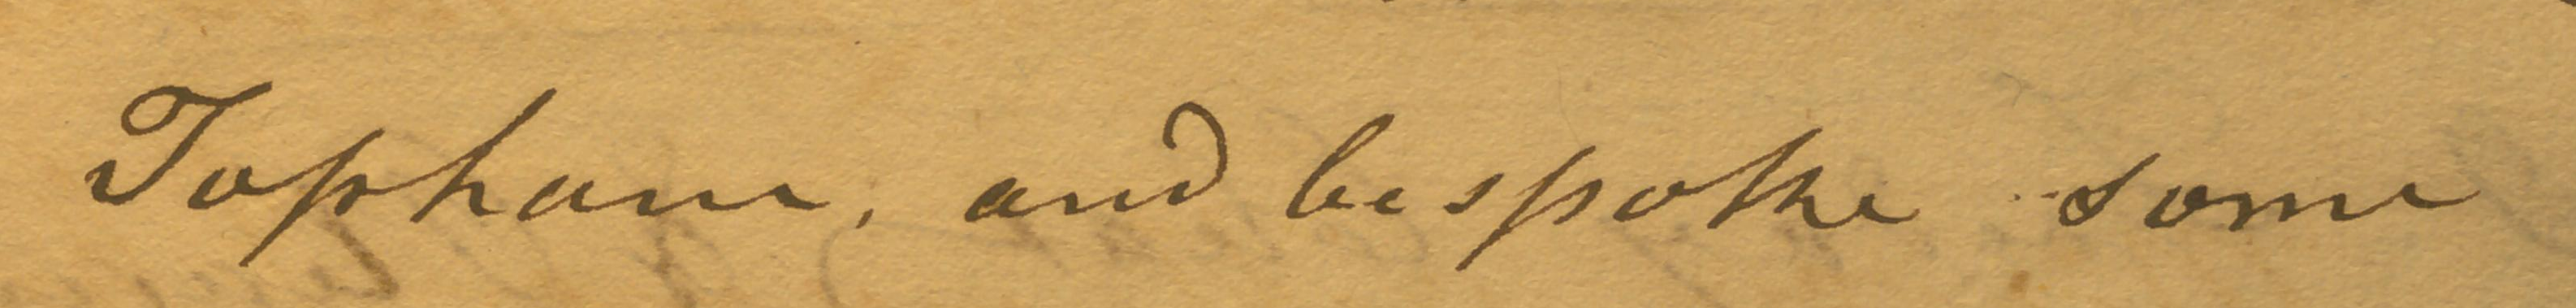Topham, and bespoke some
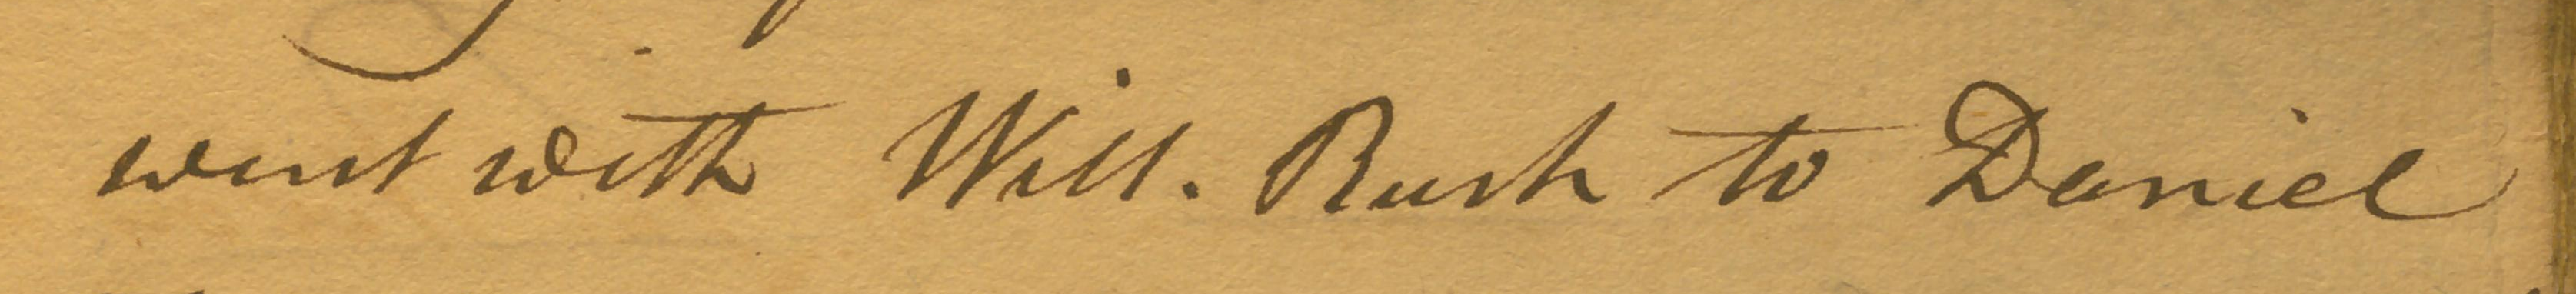went with Will. Rush to Daniel
